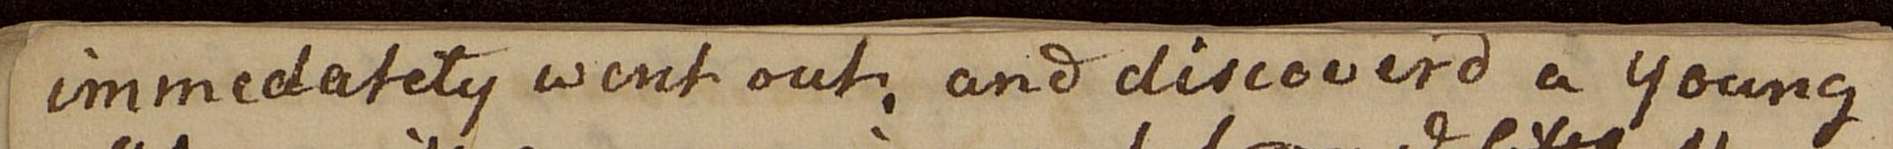immedately went out, and discoverd a young
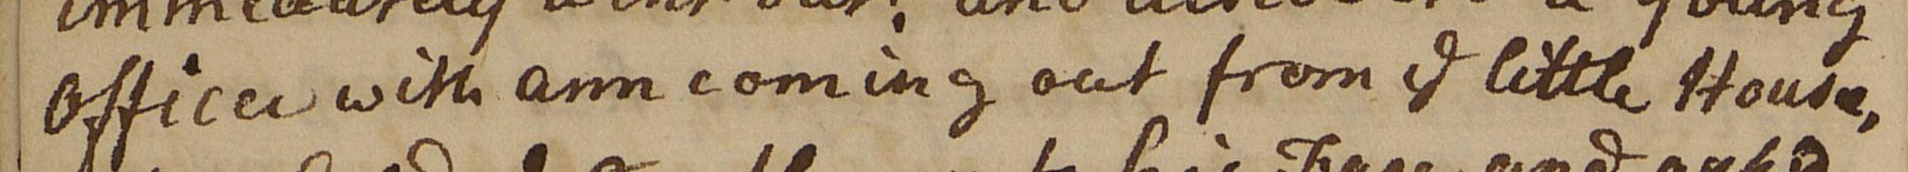Officer with Ann coming out from y^e little House,
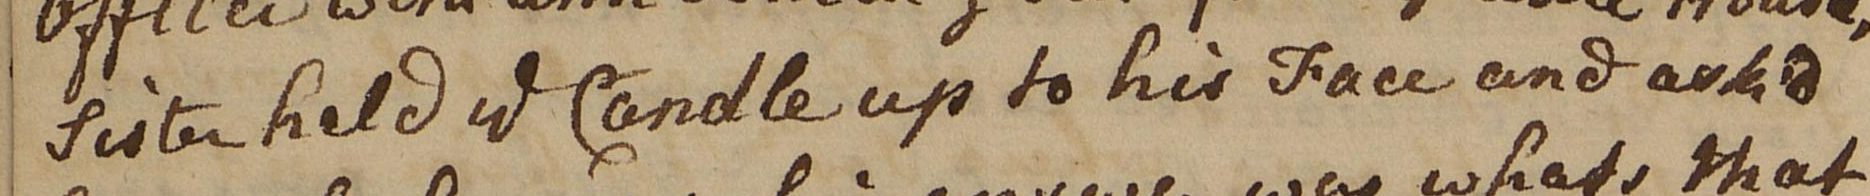Sister held y^e Candle up to his Face and ask'd
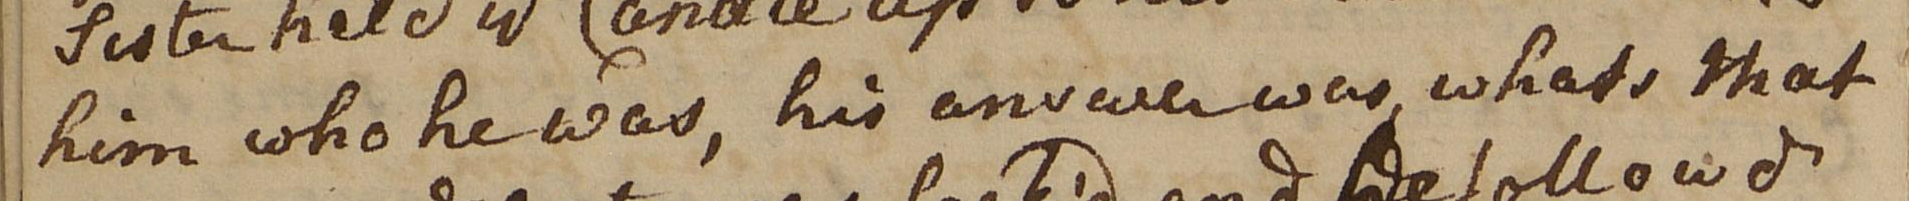him who he was, his answer was whats that
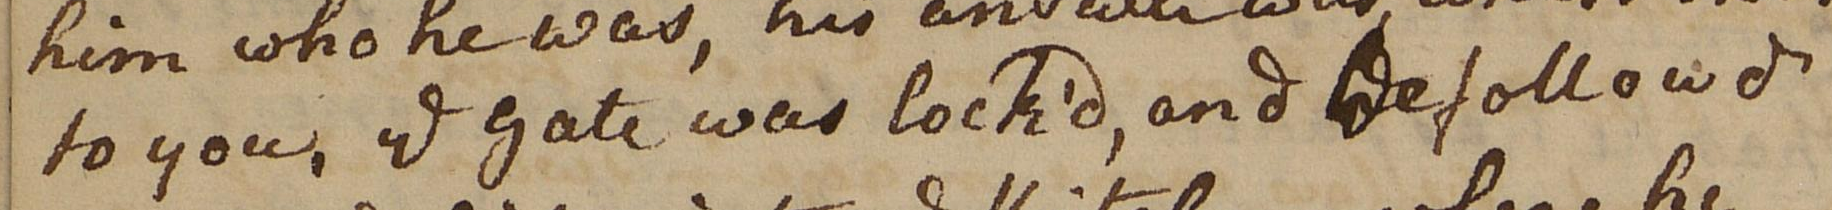to you, y^e gate was lock'd, and he followd
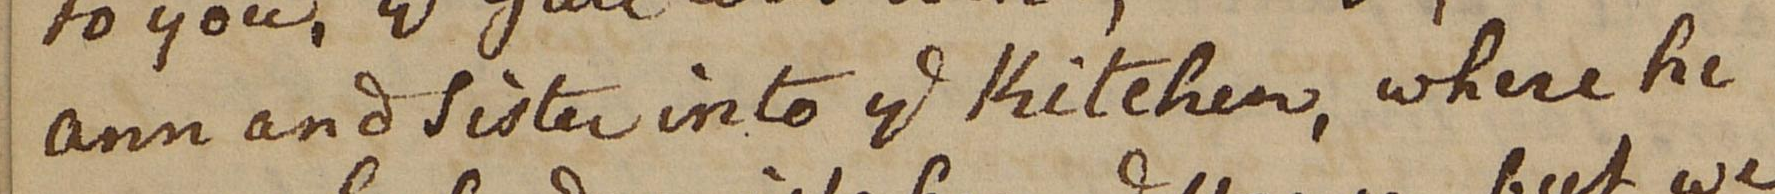Ann and Sister into y^e Kitchen, where he
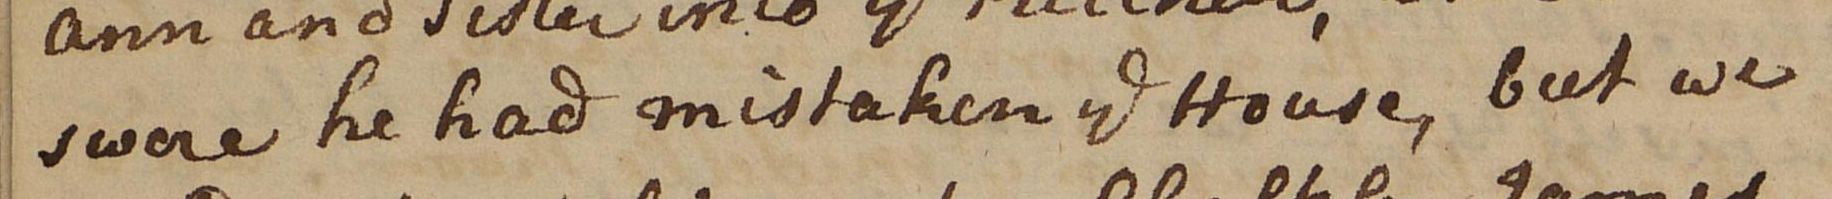sware he had mistaken y^e House, but we
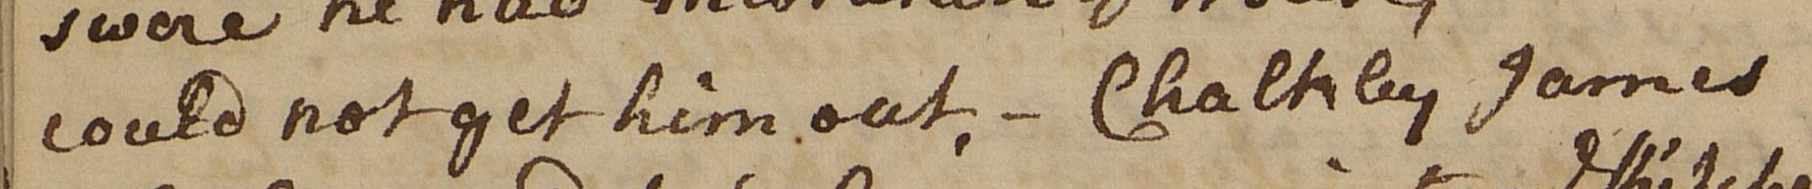could not get him out,- Chalkly James
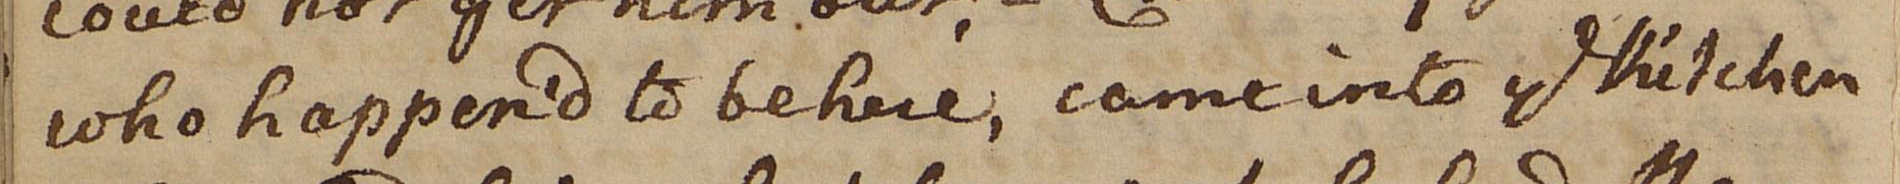who happen'd to behere, came into y^e kitchen
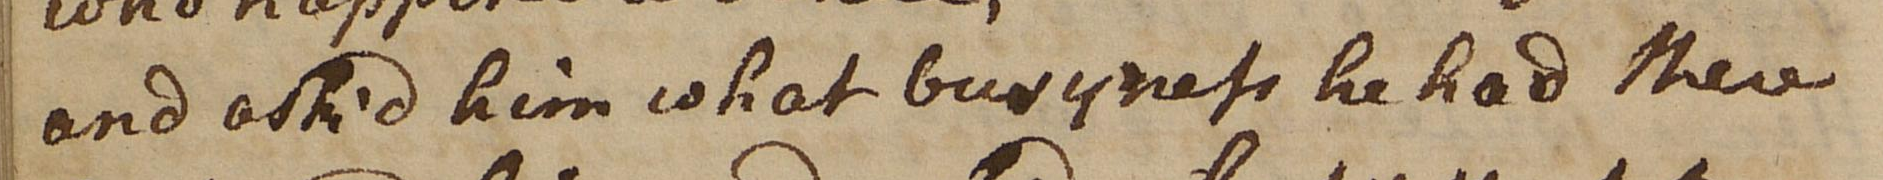and ask'd him what busyness he had there
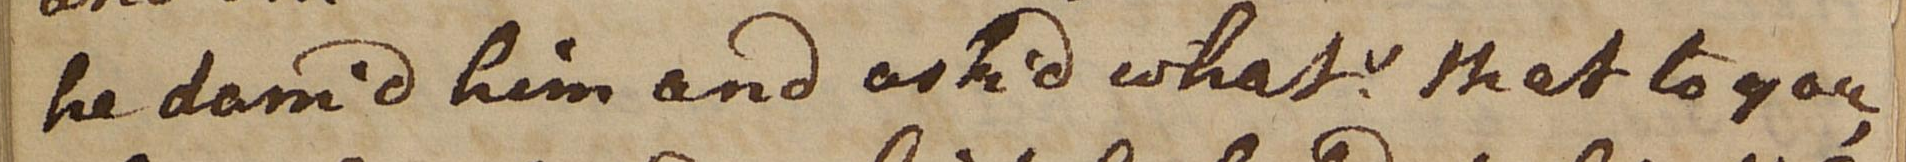he dam'd him and ask'd what^s. that to you,
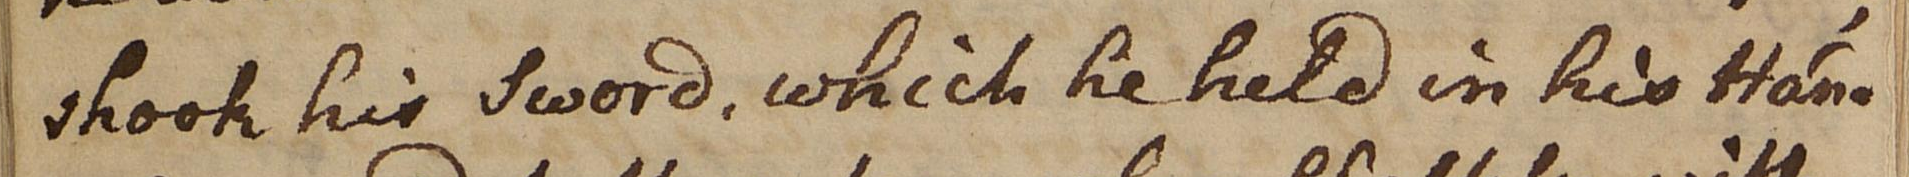shook his Sword, which he held in his Hand
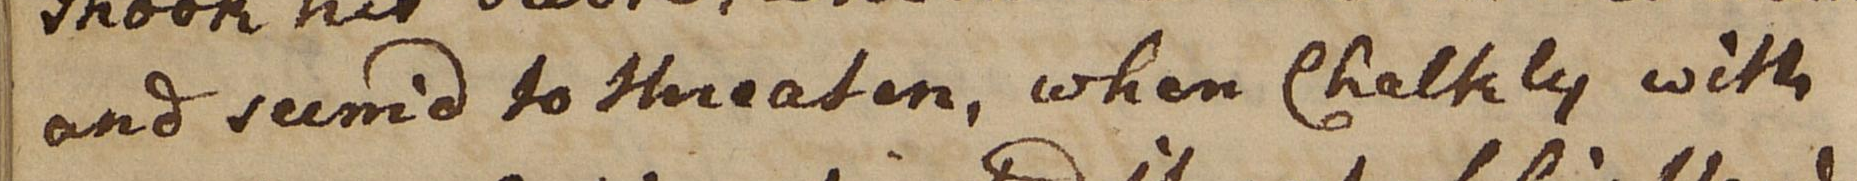and seem'd to threaten, when Chalkly with
